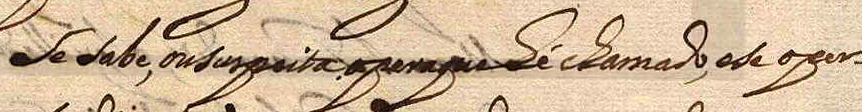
Se sabe, ou suspeita o pera que hé chamado, e se o per
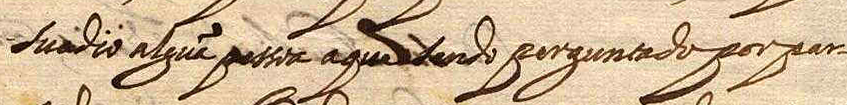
suadio alguā pessoa a que sendo perguntado por par
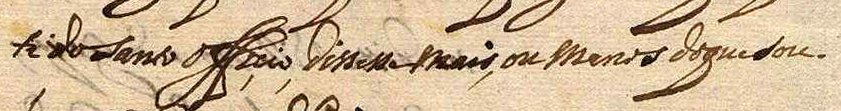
te do santo offiçio, dissesse mais, ou menos do que sou
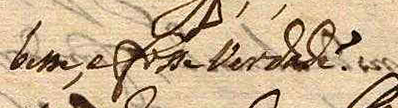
besse, e fosse verdade?
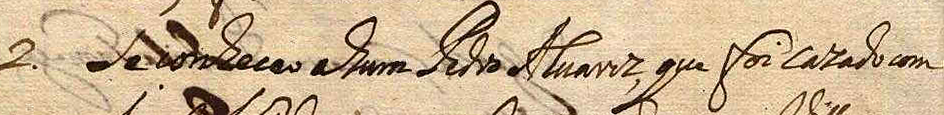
2. Se conheceo a hum Pedro Aluarez, que foi cazado com
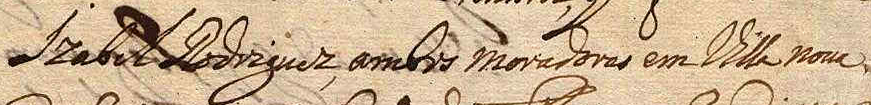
Izabel Rodriguez, ambos moradores em Villa noua
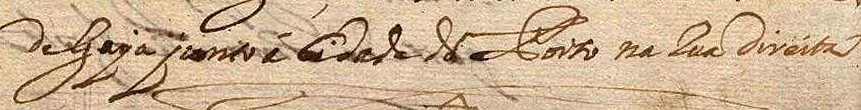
de Gaya junto á Cidade do Porto na Rua direita
